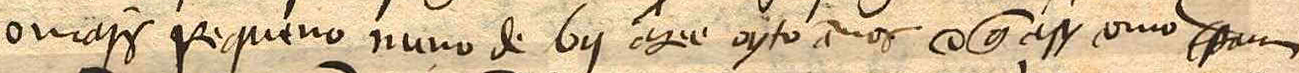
o majs pequeno nuno de bij atee oyto ānos e q̄ asy como Estam
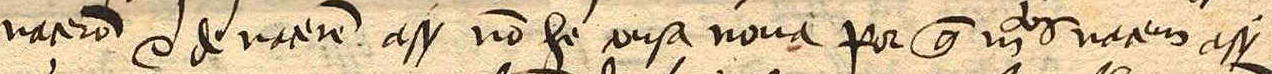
naçerō e de nacerē asy nō he cousa noua porq̄ mtos nacem asy
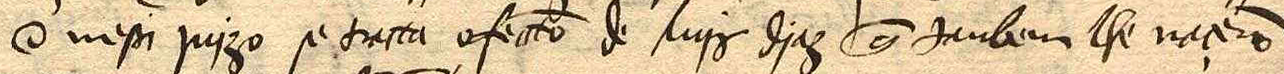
e nesti Jujzo se tracta o fec̄cto de lujs djaz q̄ tanbem lhe naçer̄o
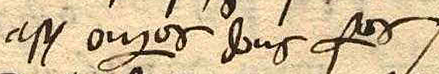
asy outos dous fos /
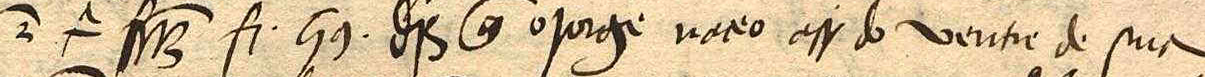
item ca fr̄rz fi. 59. djz q̄ o Jorge naceo asy do ventre de sua
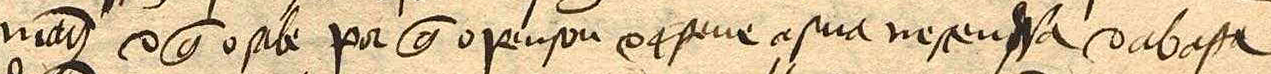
mãy e q̄ o sabe porq̄ o pensou e Esteue a sua nescenssa e abasta
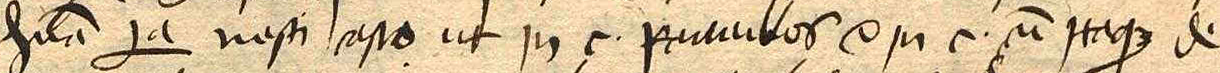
hūa ta nesti casso ut jn c. paruullos e jn c. cū jtaꝙ de
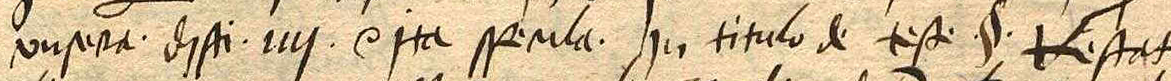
consecra. djsti. iiij. e jta specula. jn titulo de teste .§. Restat
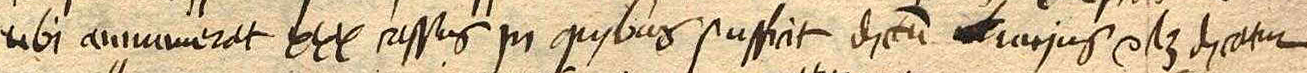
ubi annumerat xxx cassus jn qujbus sufficit djct̄u _ unjus e lꝫ djcatur
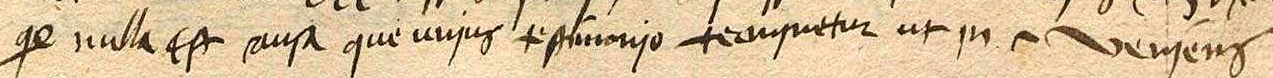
ꝙe nulla Est causa que unjus testimonjo termjnetur ut jn c veniens
